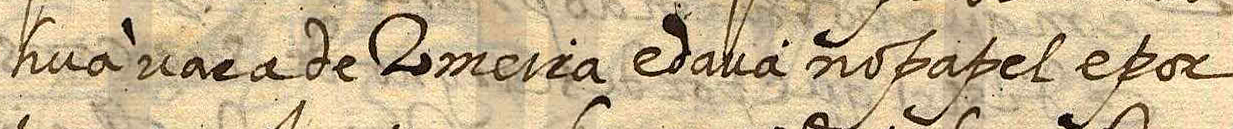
huā uara de Romeira e daua no papel e por
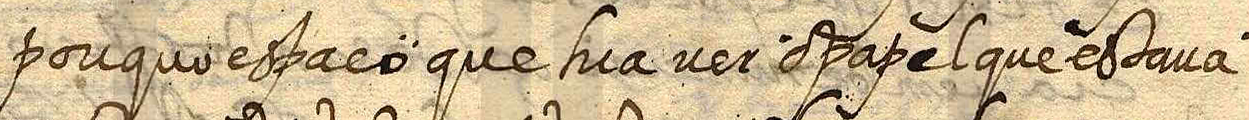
pouquo espaco que hia uer o papel que estaua
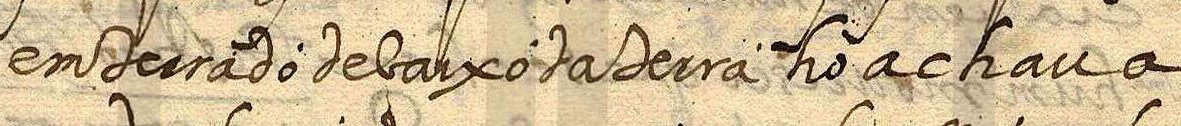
emterrado debaixo da terra ho achaua
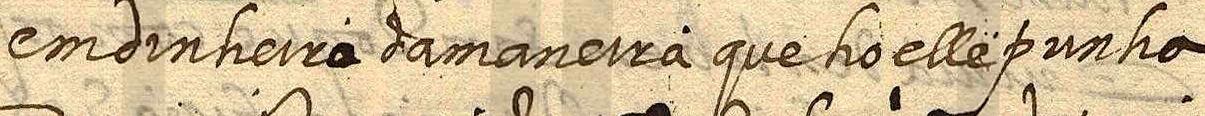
em dinheiro da maneira que ho elle punha
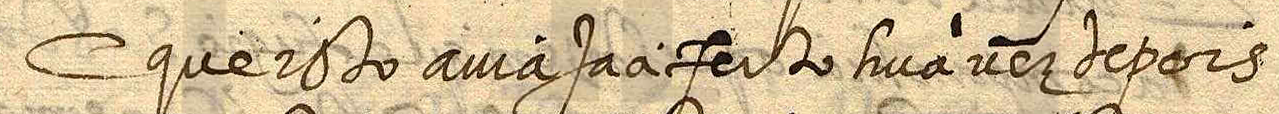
e que isto auia Jaa feito hua uez depois
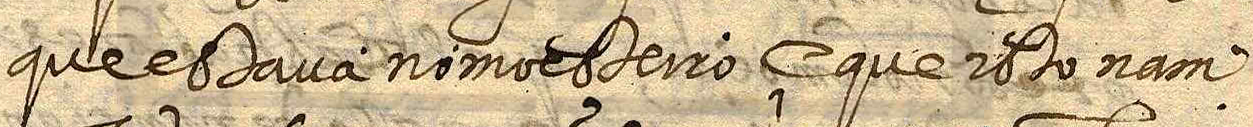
que estaua no moesteiro e que isto nam
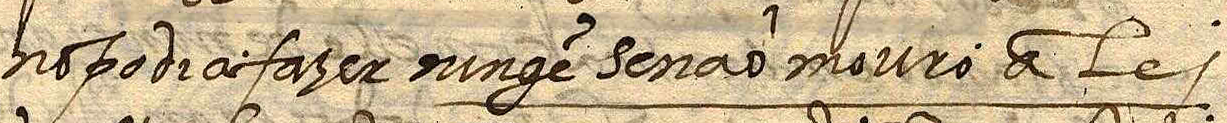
no podia fazer ningē senaõ mouro a Lej
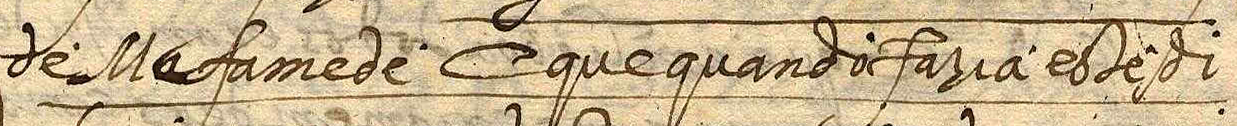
de Mafamede e que quando fazia este di
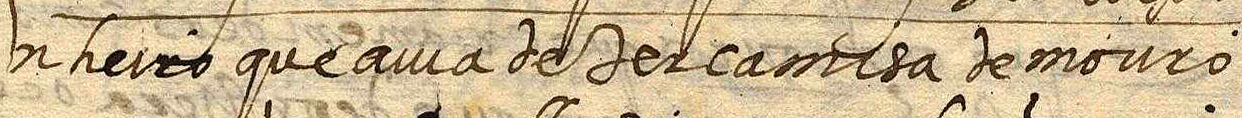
nheiro que auia de ter camisa de mouro
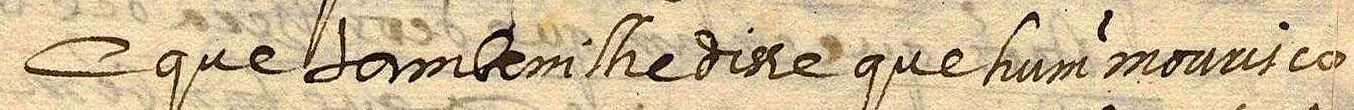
e que tambem lhe disse que hum mourisco
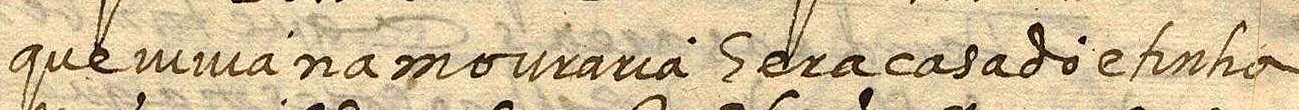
que uiuia na mouraria E era casado e tinha
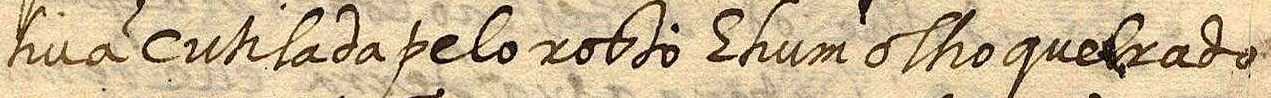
huā cutilada pelo rosto E hum olho quebrado
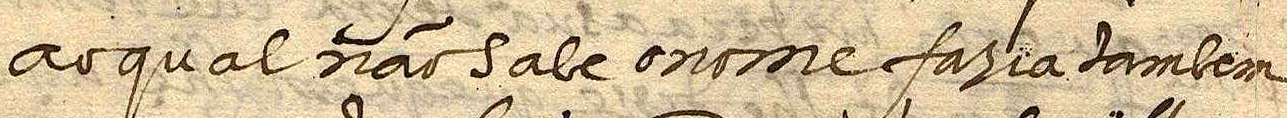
ao qual naõ sabe o nome fazia tambem
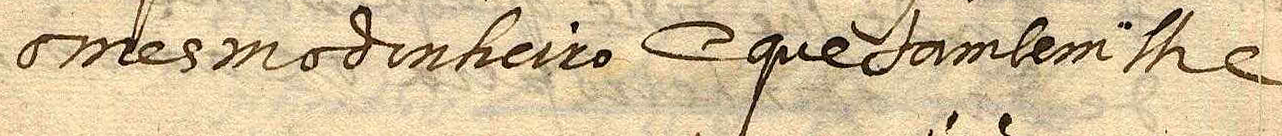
o mesmo dinheiro e que tambem lhe
